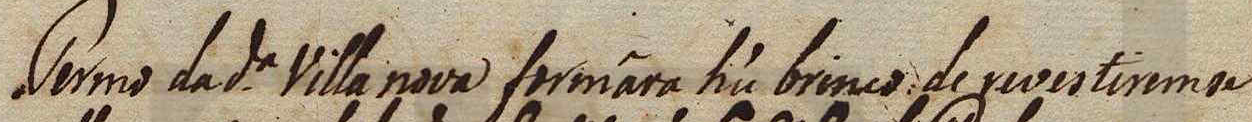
Termo da d.a Villa nova formára hū brinco de revestiremse
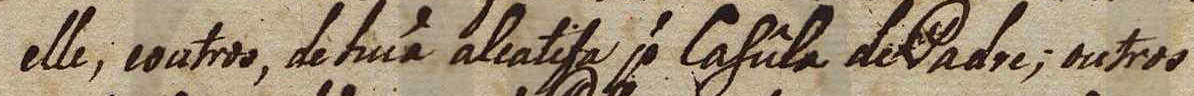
elle, e outros, de huā alcatifa p̄ Casûla de Padre; outros
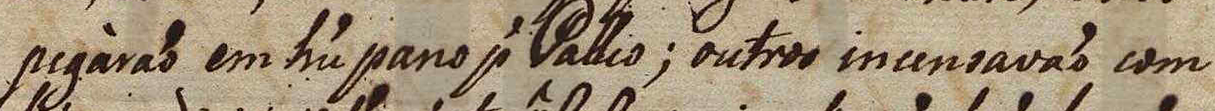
pegàraõ em hū pano p̄ Pallio; outros incensavaõ com
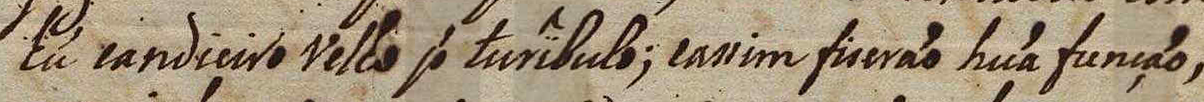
hū candieiro velho p̄ turibulo; e assim fiseraõ huā funçaõ,
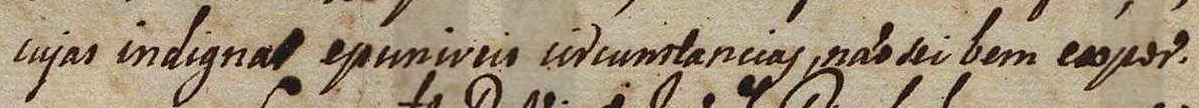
cujas indignas, e puniveis circunstancias, naõ sei bem expor.
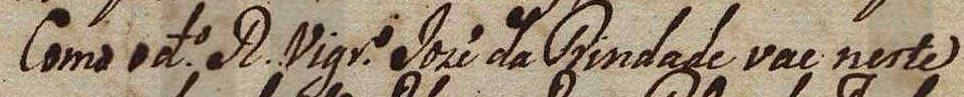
Como o d̄.o R. Vigr.o Iozé da Trindade vae neste
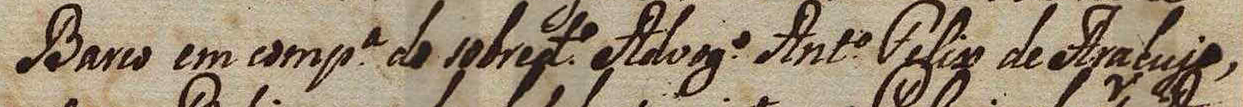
Barco em comp.a do sobred̄.o Advog.o Ant.o Felix de Arahujo,
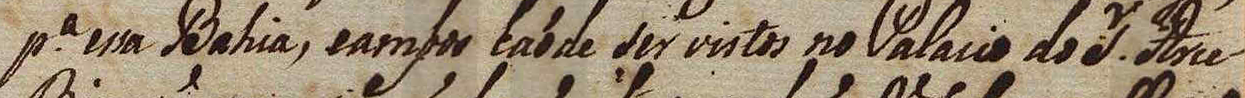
p.a essa Bahia, e ambos haõ de ser vistos no Palacio do S.r Arce
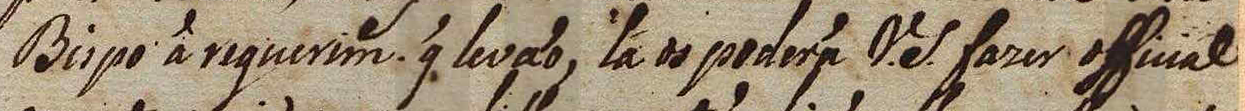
Bispo á requerim. q̄ levão, lá os poderá V.S. fazer official
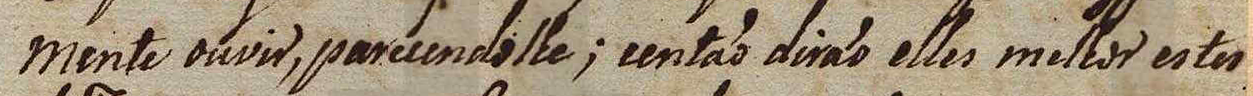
mente ouvir, parecendolhe; e entaõ diraõ elles melhor estes
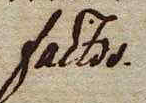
factos.
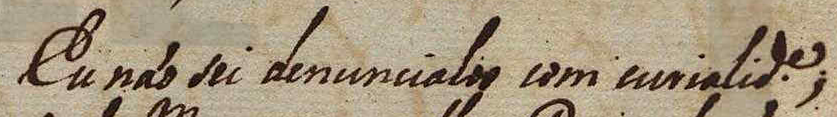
Eu naõ sei denuncialos com curialid.e;
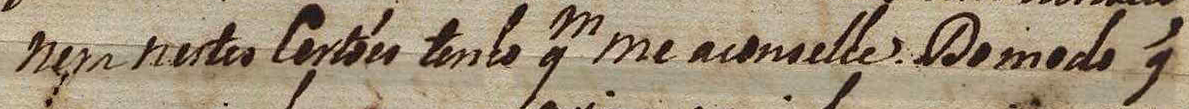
nem nestes Certões tenho qm me aconselhe. Do modo q̄
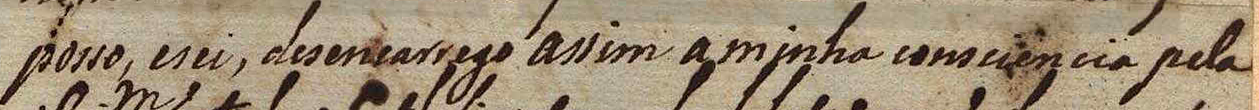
posso, e sei, desencarrego assim a minha consciencia pela
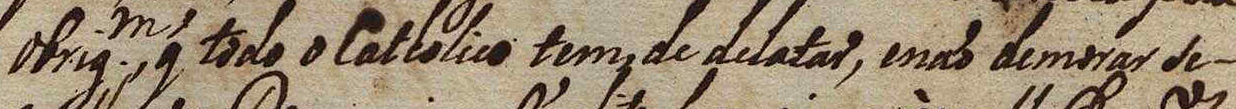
obrig.m, q̄ todo o Catholico tem, de delatar, e naõ demorar se
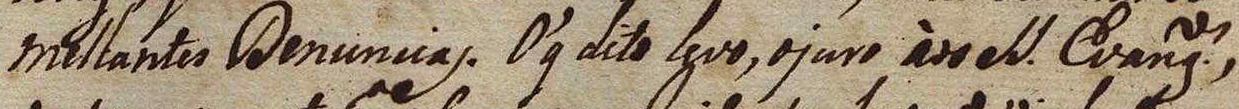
melhantes Denuncias. O q̄ dito levo, o juro áos SS. Evang.os,
